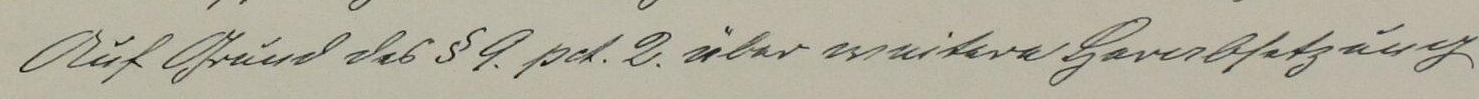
Auf Grund des § 9. pct. 2. über weitere Herabsetzung
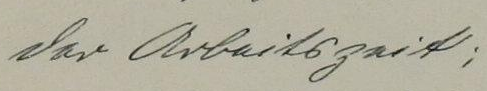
der Arbeitszeit;
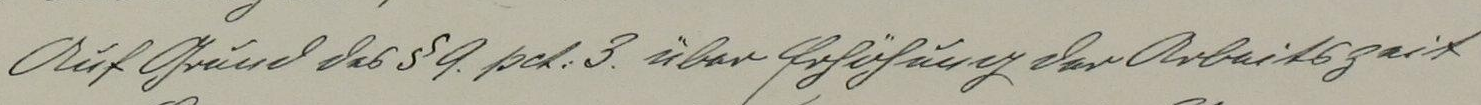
Auf Grund des § 9. pct. 3. über Erhöhung der Arbeitszeit
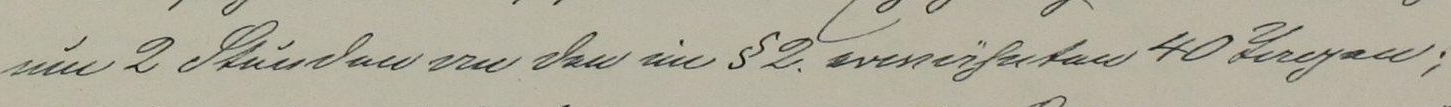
um 2 Stunden an den in § 2. erwähnten 40 Tagen;
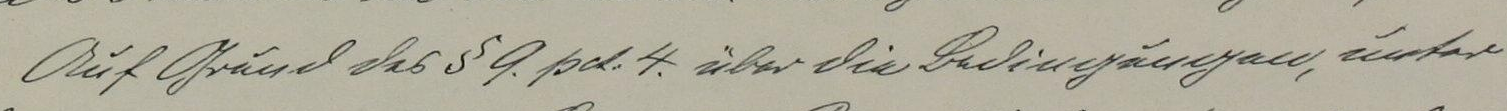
Auf Grund des § 9. pct. 4. über die Bedingungen, unter
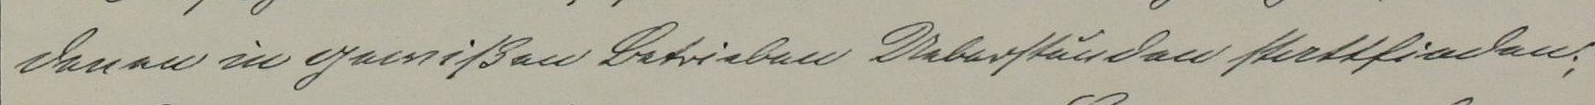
denen in gewißen Betrieben Ueberstunden stattfinden;
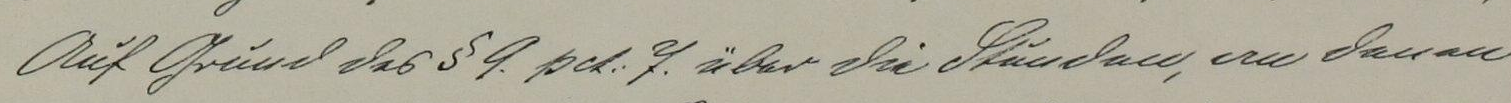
Auf Grund des § 9 pct. 7. über die Stunden, an denen
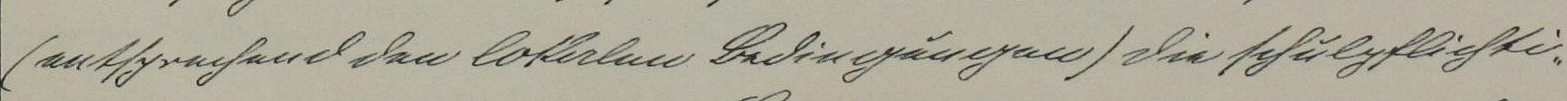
(entsprechend den lokalen Bedingungen) die schulpflichti-
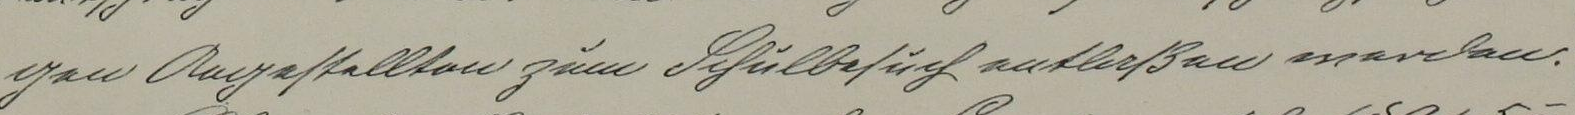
gen Angestellten zum Schulbesuch entlaßen werden.
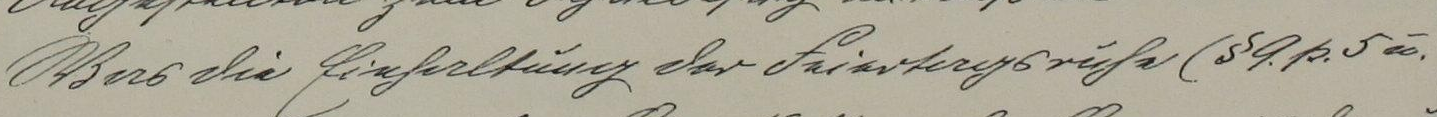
Was die Einhaltung der Feiertagsruhe (§ 9. p. 5 u.
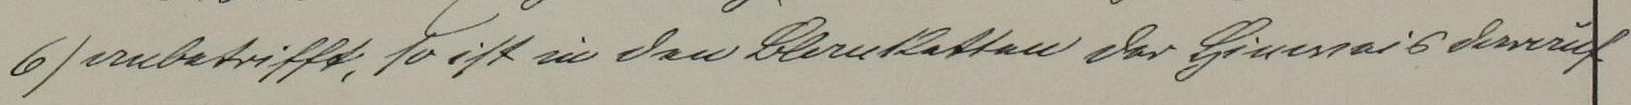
6) anbetrifft, so ist in den Blanketten der Hinweis darauf
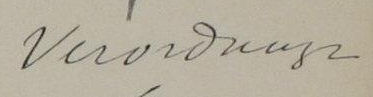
Verordnung
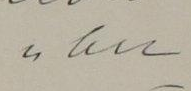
über
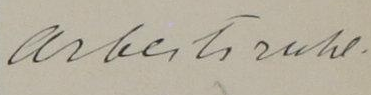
Arbeitsruhe
